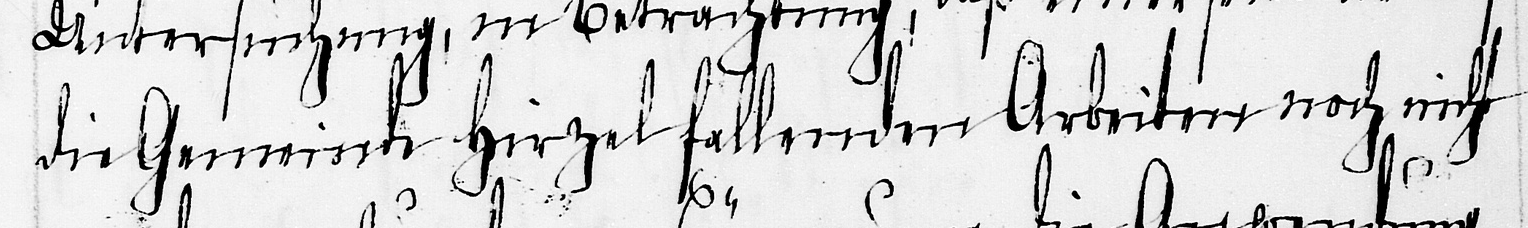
die Gemeinde Hirzel fallenden Arbeiten noch nicht
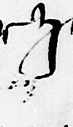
11.
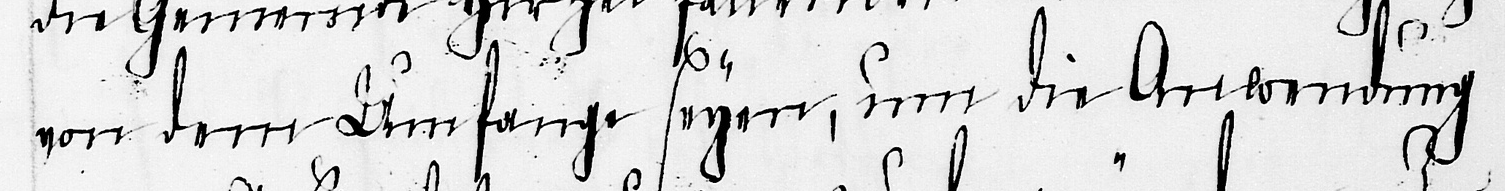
von dem Umfange seyen, um die Anwendung
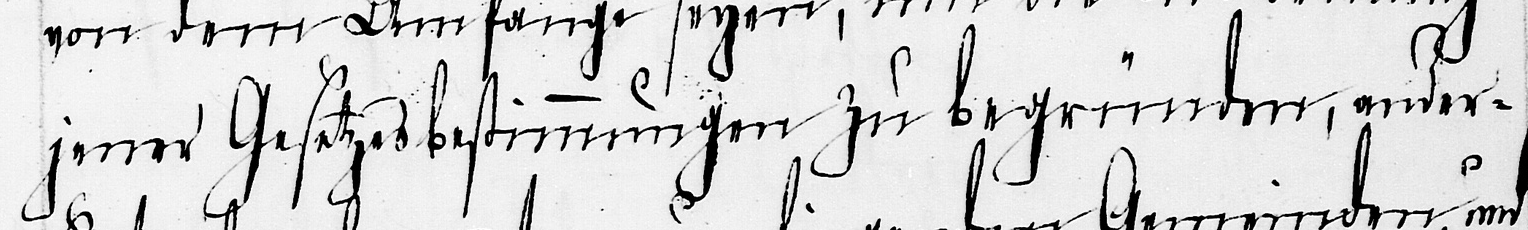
jener Gesetzesbestimmungen zu begründen, ander¬
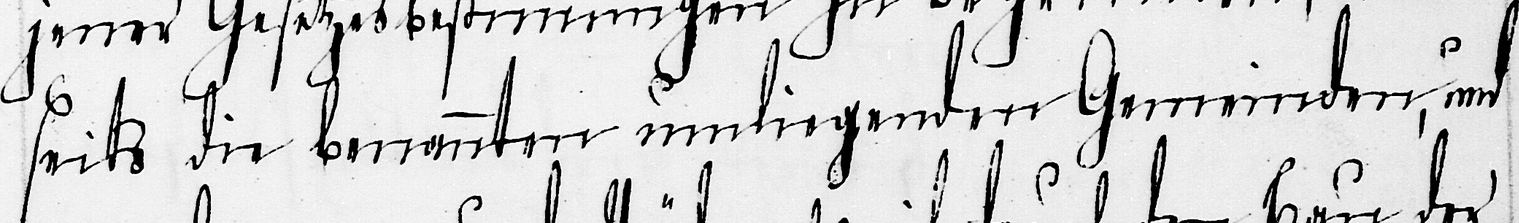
seits die benannten umliegenden Gemeinden, und
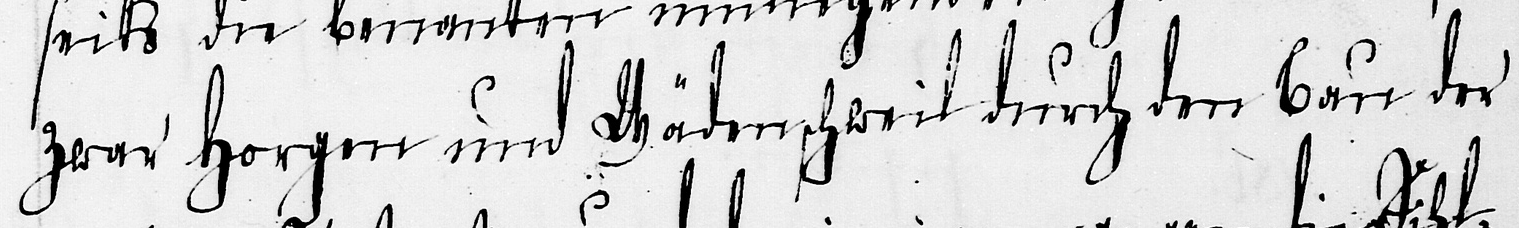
zwar Horgen und Wädenschweil durch den Bau der
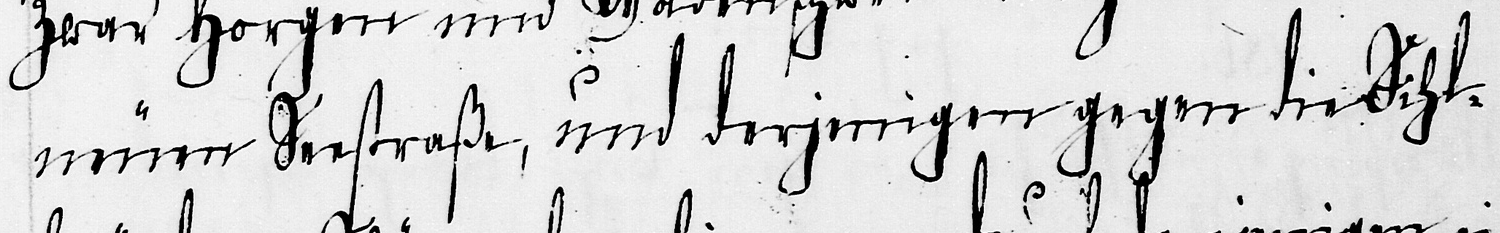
neuen Seestraße, und derjenigen gegen die Sihl¬
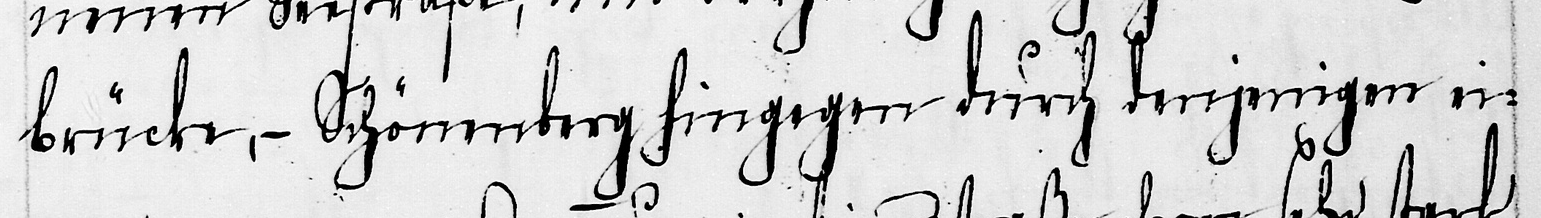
brücke, − Schönenberg hingegen durch denjenigen ei¬
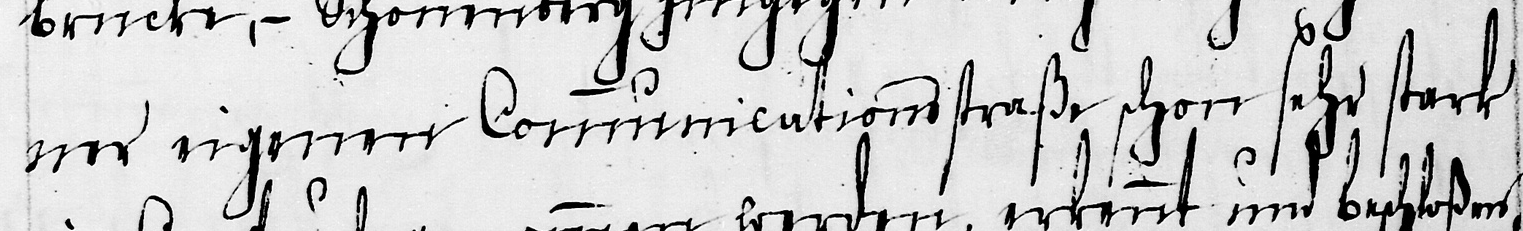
ner eigenen Communicationsstraße schon sehr stark
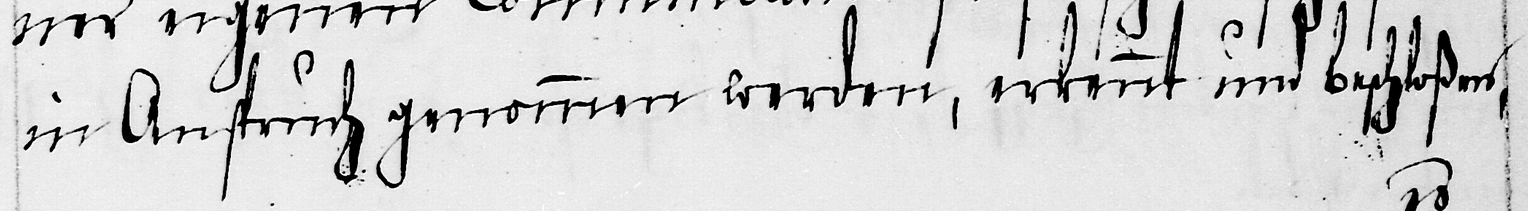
in Anspruch genommen werden, erkennt und beschloßen,
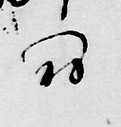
des
